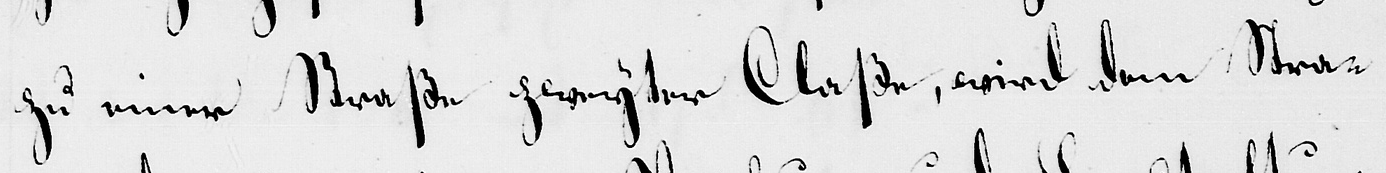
zu einer Straße zweyter Claße, wird dem Stra¬
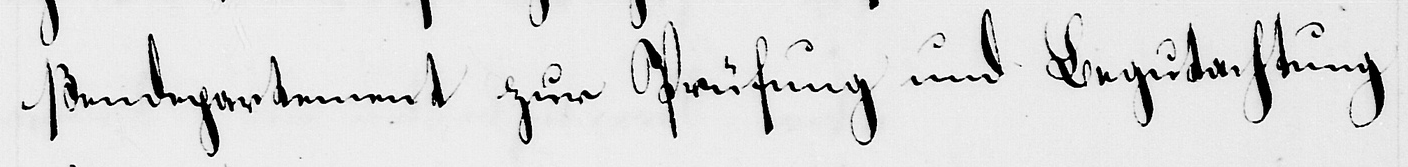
ßendepartement zur Prüfung und Begutachtung
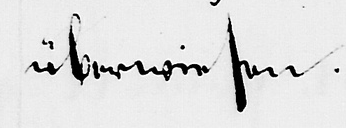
überwiesen.
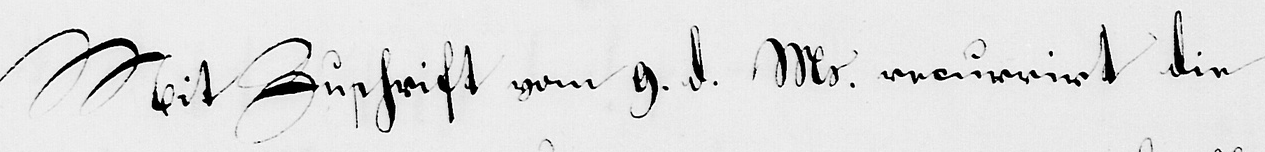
Mit Zuschrift vom 9. d. Ms. recurrirt die
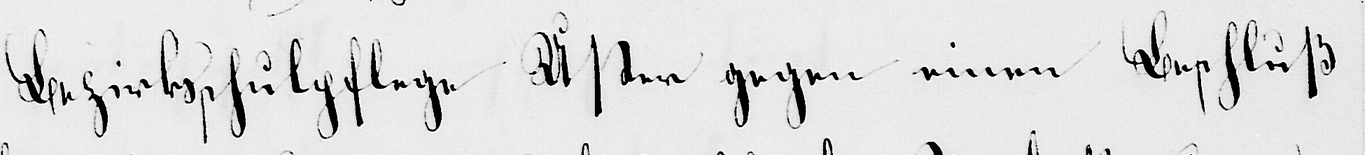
Bezirksschulpflege Uster gegen einen Beschluß
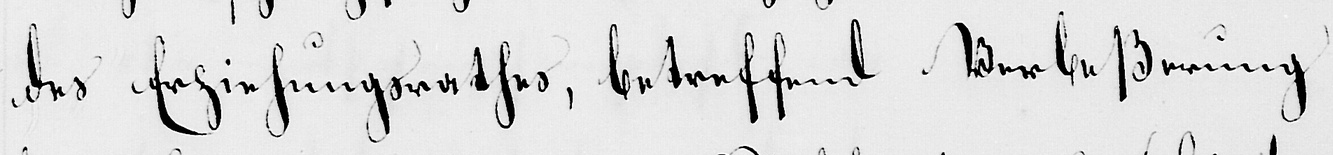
des Erziehungsrathes, betreffend Verbeßerung
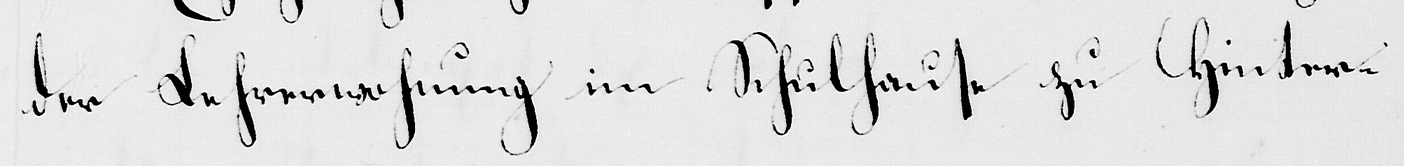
der Lehrerwohnung im Schulhause zu Hintere¬
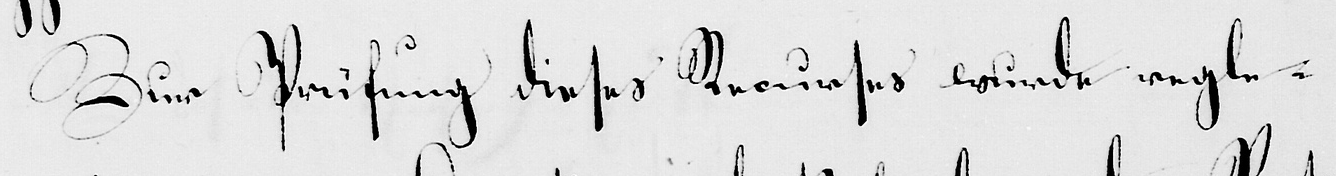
Zur Prüfung dieses Recurses wurde regle¬
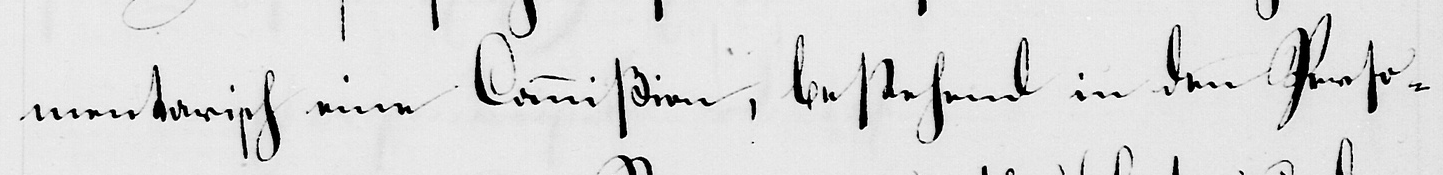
mentarisch eine Commißion, bestehend in den Perso¬
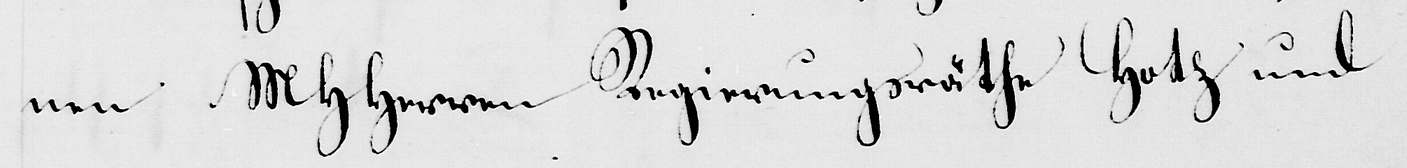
nen MHHerren Regierungsräthe Hotz und
